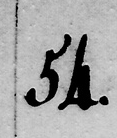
4.
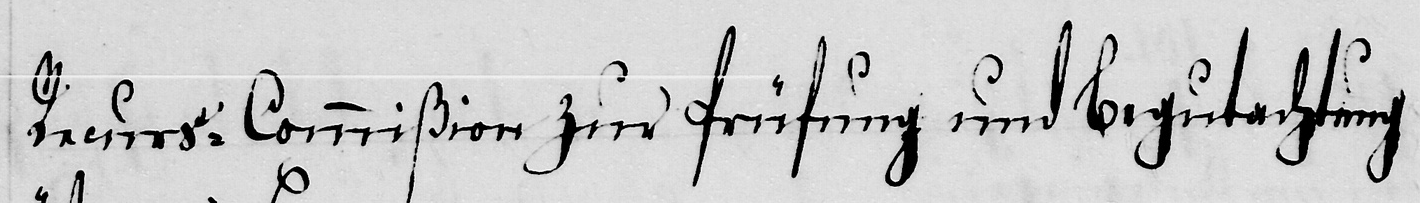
Recurs-Commißion zur Prüfung und Begutachtung
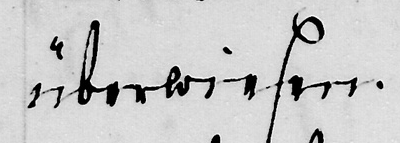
überwiesen.
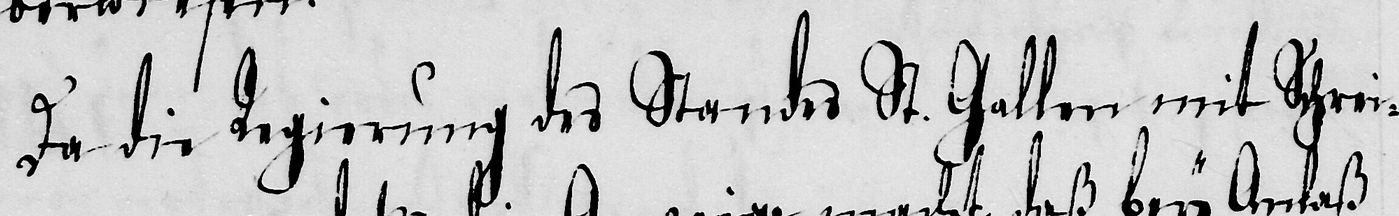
Da die Regierung des Standes St.Gallen mit Schre¬
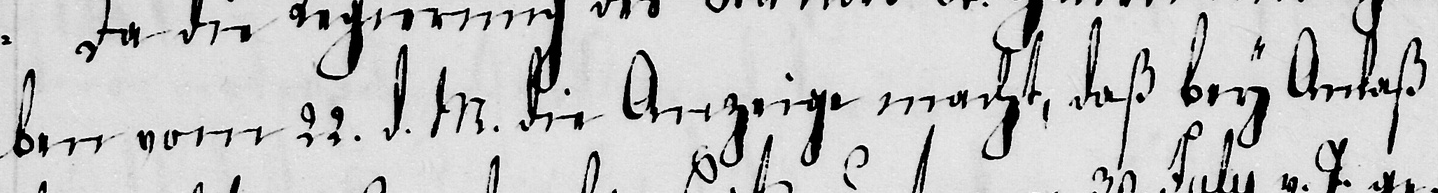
iben vom 22. d. M. die Anzeige macht, daß bey Anlaß
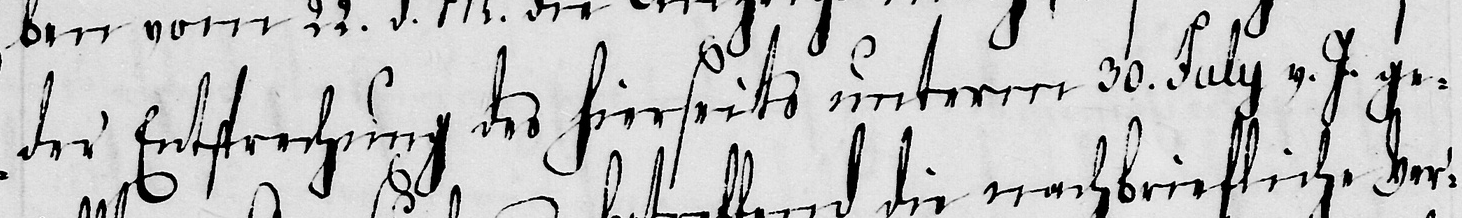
der Entsprechung des hierseits unterm 30. July v. J. ge¬
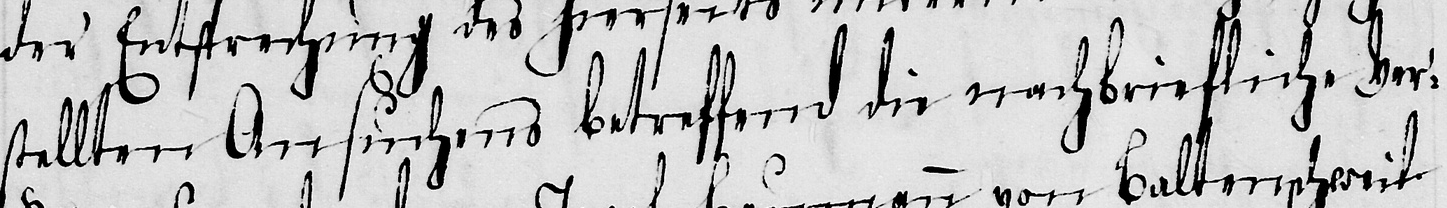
tellten Ansuchens betreffend die nachbriefliche Ver¬
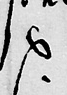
s¬
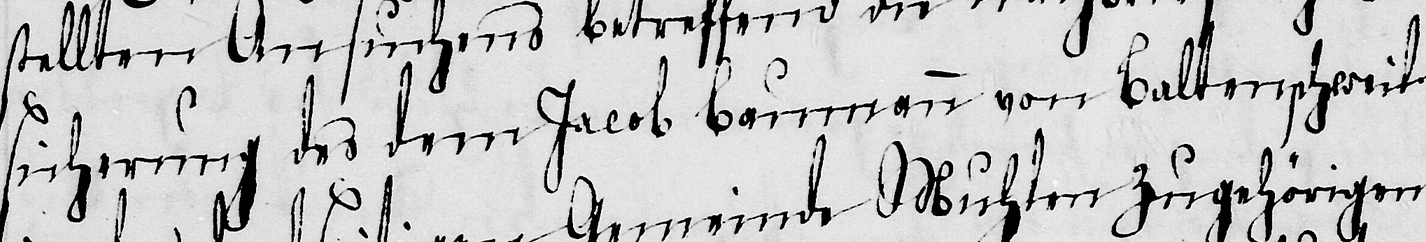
sicherung des dem Jacob Baumann von Baltenschweil
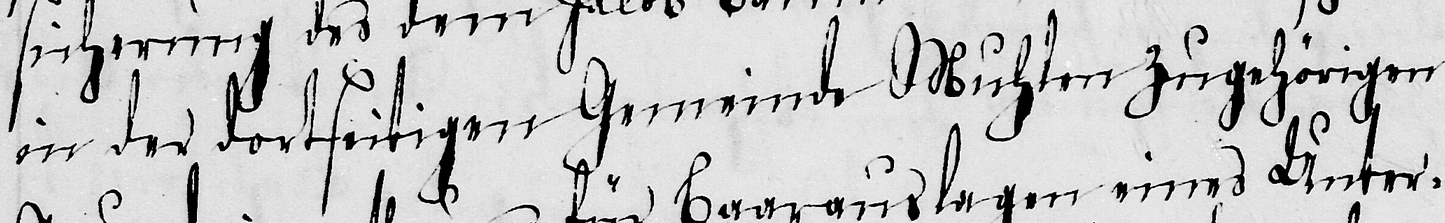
in der dortseitigen Gemeinde Muhlen zugehörigen
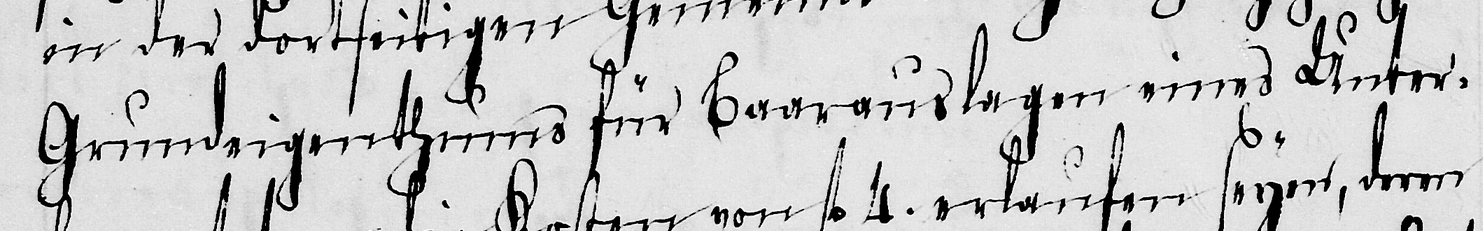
Grundeigenthums für Baarauslagen eines Unter¬
